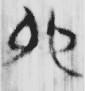卯
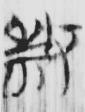殺
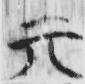亓（其）
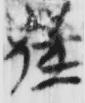○（兄）
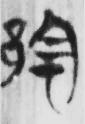陰
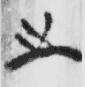之
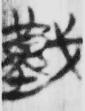○（勤）
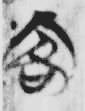客
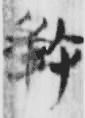搏（捕）
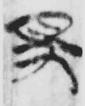○（得）
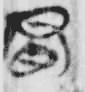冒
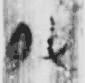卯
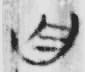自
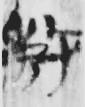殺
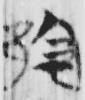陰
